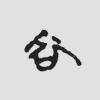各
